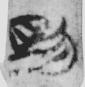則
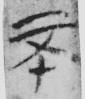不
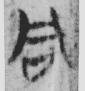同
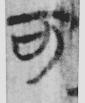可
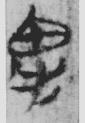{胃刀}（謂）
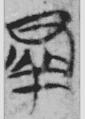群
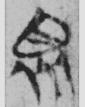眾
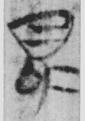鳥
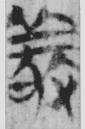敬
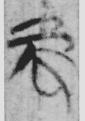而
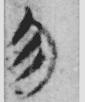勿
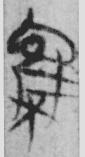{宀集}（集）
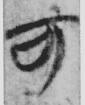可
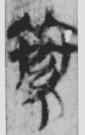索
